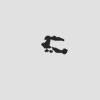正
